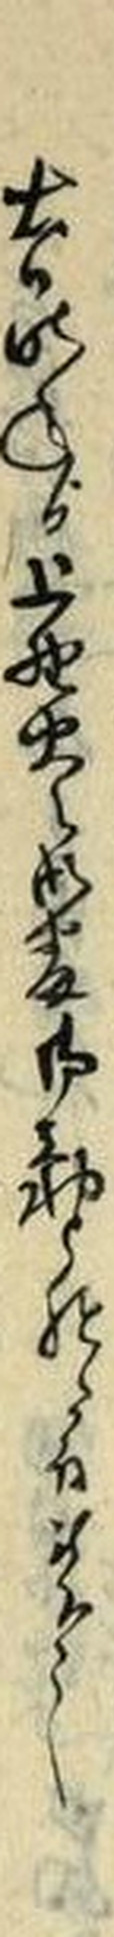右ハ昨年ゟ上野火之御番御勤被遊候ニ付被下之
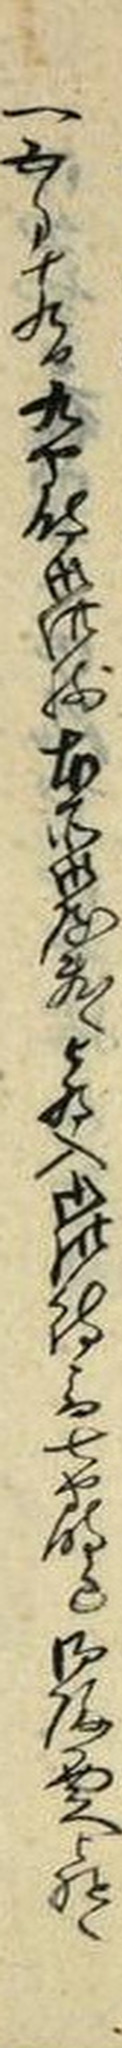一五月十九日九半時御供揃本所御屋敷へ被為入御供待ニ而七半時過御帰殿被遊候

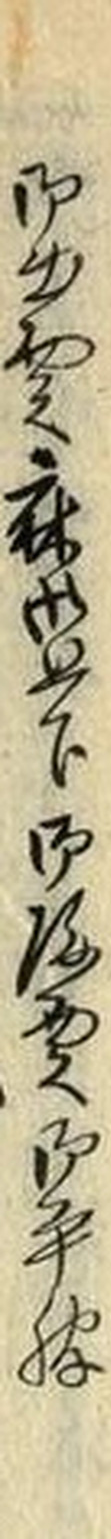御出殿麻上下御帰殿御平服
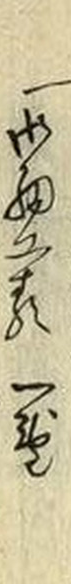御細工類一台
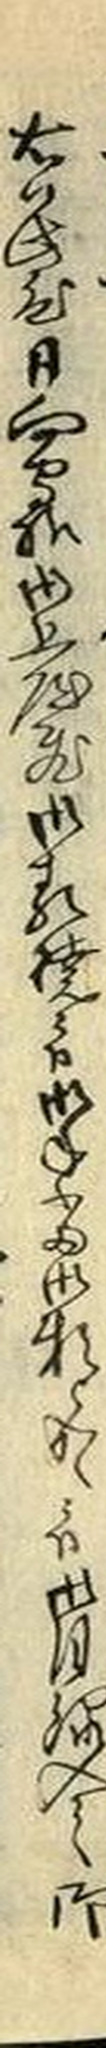右ハ此度日向守様御上屋敷御類焼ニ付御手当御頼被成候ニ付御目録入之御
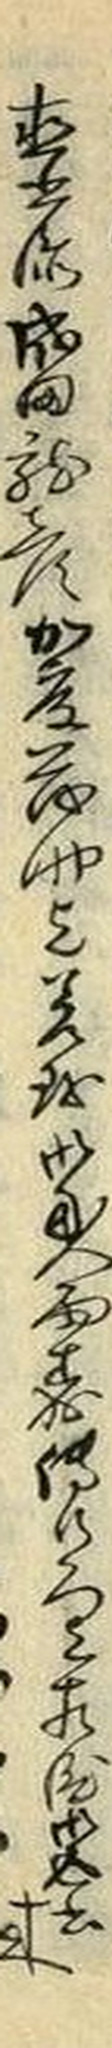直書添成田龍彦加藤茂助迄差越御用人雨森伝左衛門迄相渡御返書来
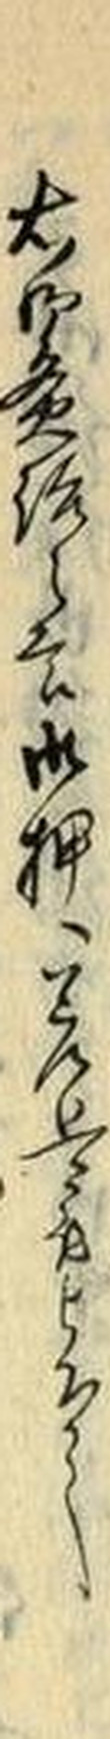右御灸治之節御押へ差上候ニ付被下之
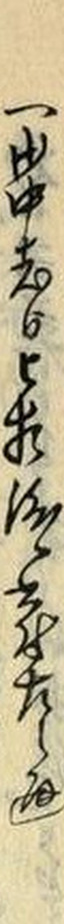一御中老ゟ被相渡候書付左之通
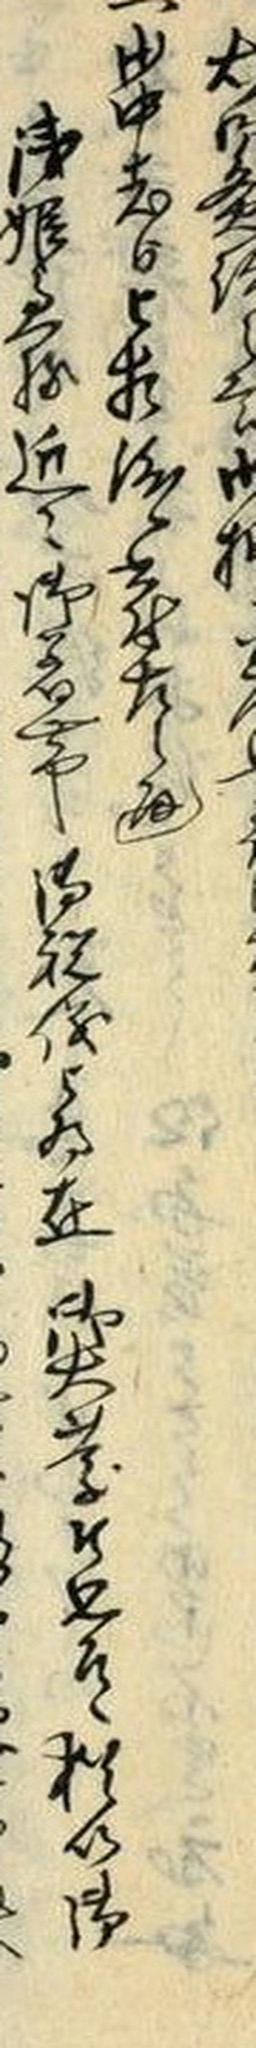浅姫君様近々御着帯御祝儀被為在御大慶被思召候猶以御
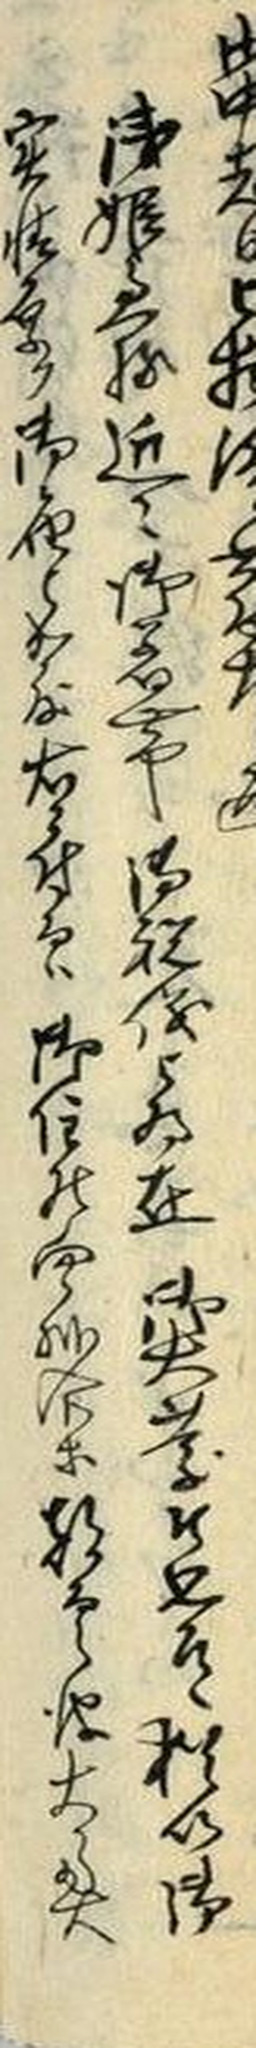実情厚ク御届被成度右ニ付而ハ御住居向之掛合等都而之儀大奥
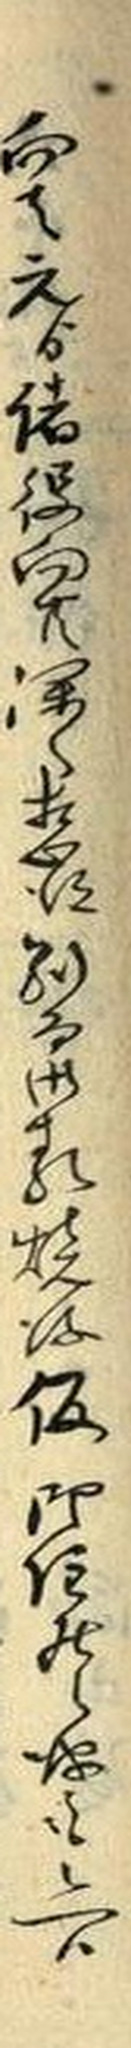向は元ゟ諸役向共深く相心得別而御類焼後仮御住居之儀ニ候へハ
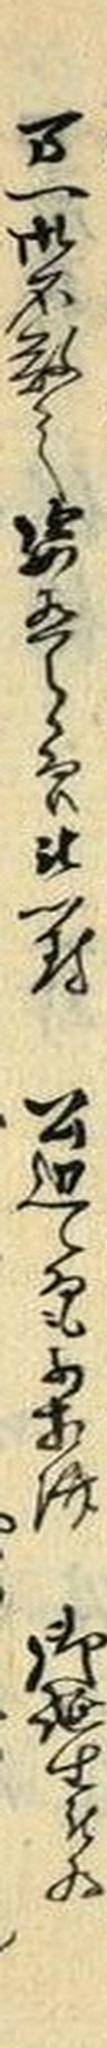万一御不敬之姿有之候而ハ被対公辺候而も不相済御誕生被為
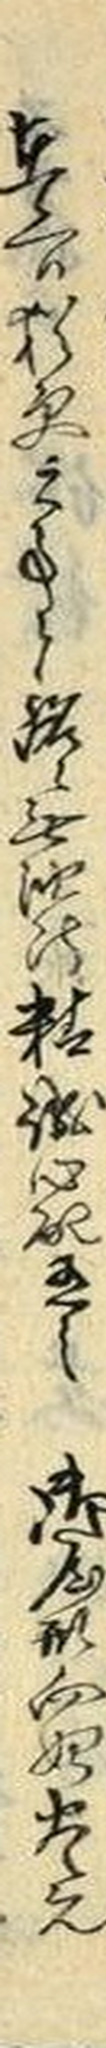在候へハ猶更之事と銘々無油断精誠心配有之御屋形向始火之元
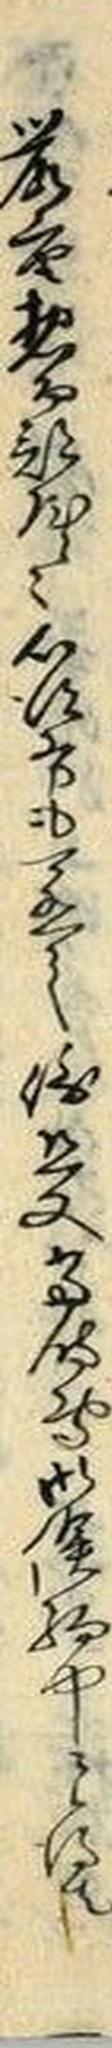厳重惣而部屋々心得方も可有之儀且又当時専御倹約中ニ候へ共
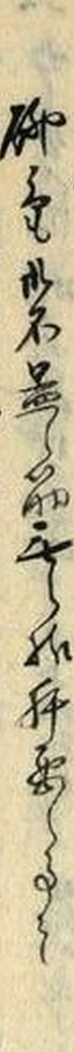聊ニ而も御不盡之筋無之様肝要之事ニ候
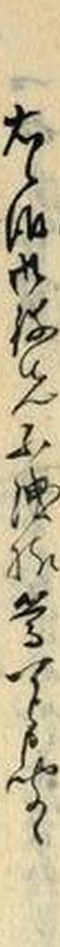右之趣御役先不洩様管可被申聞候
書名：少傅日録抄（斉承付側向頭取日記、在府）
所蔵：福井県文書館 Fukui Prefectural Archives
